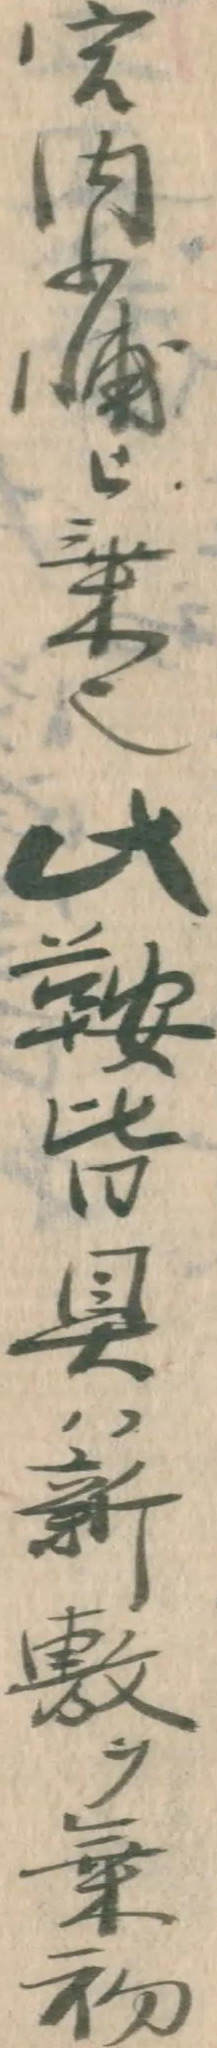宮内少輔被乗也此鞍皆具ハ新敷ヲ乗初
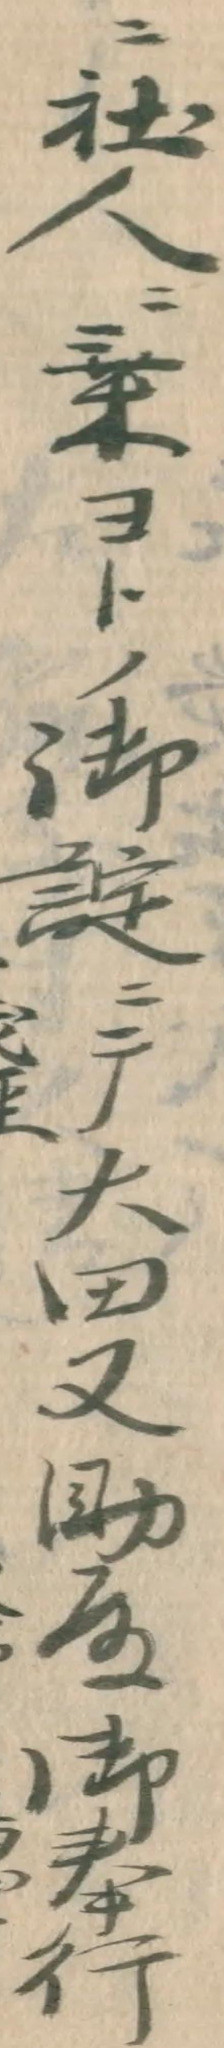ニ社人ニ乗ヨトノ御諚ニテ大田又助殿御奉行
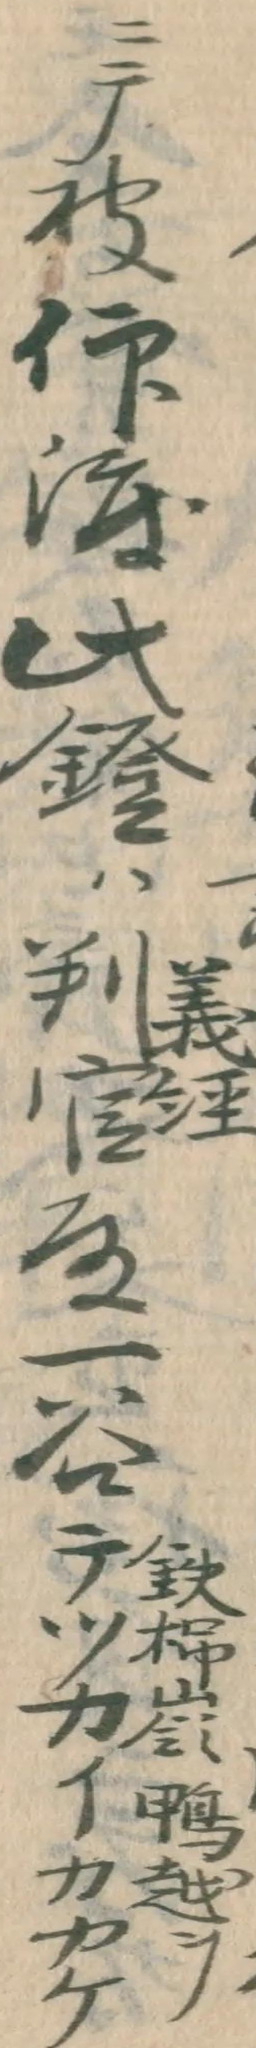ニテ被仰渡此鐙ハ判官殿一谷テツカイカカケ
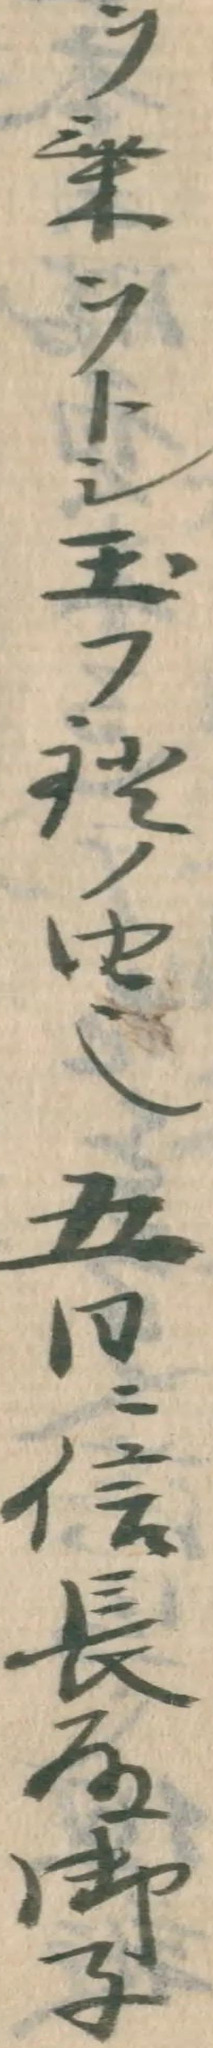ヲ乗ヲトシ玉フ鐙ノ由也五日ニ信長殿御子
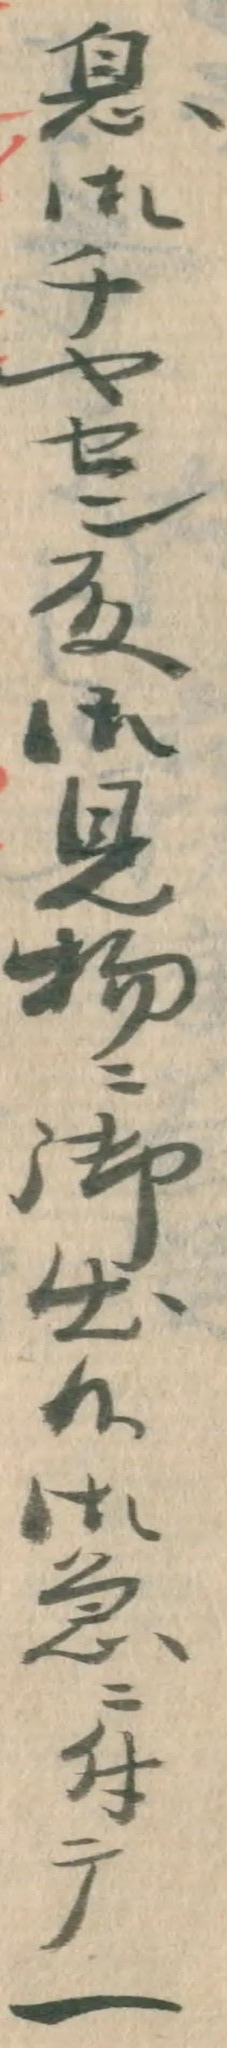息御チヤセン殿御見物ニ御出候御急ニ付テ一
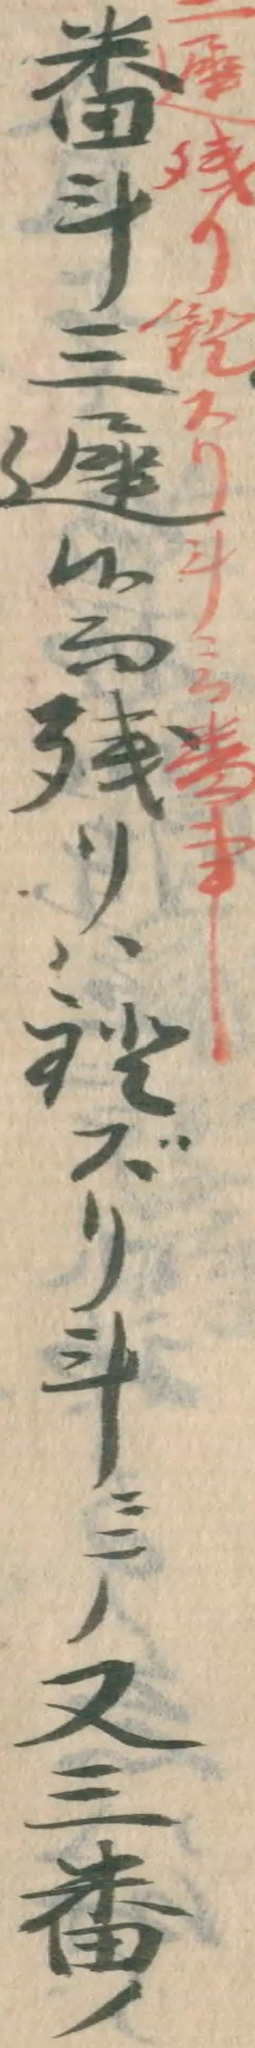番計三遅候而残リハ鐙ズリ計ニテ又三番ノ
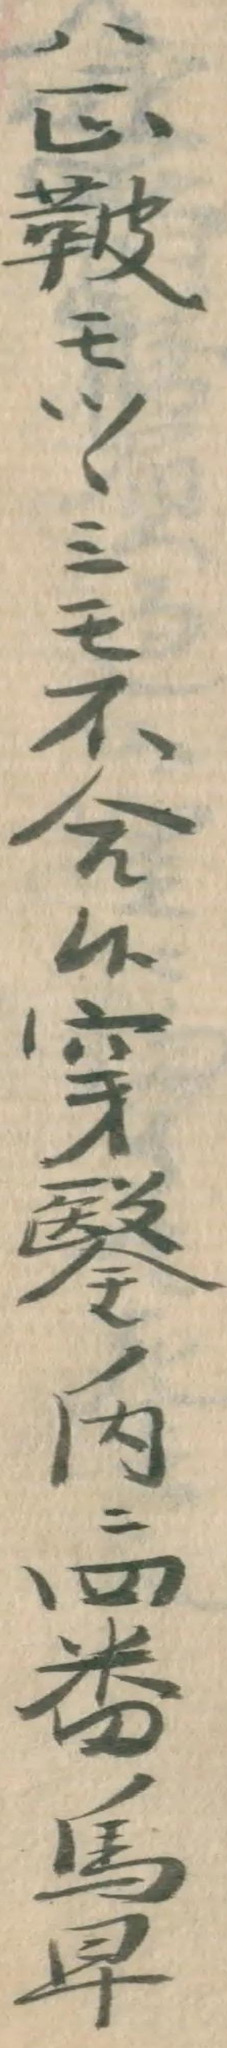ハ正鼓モツヽミモ不合候穿鑿ノ内ニ四番ノ馬早
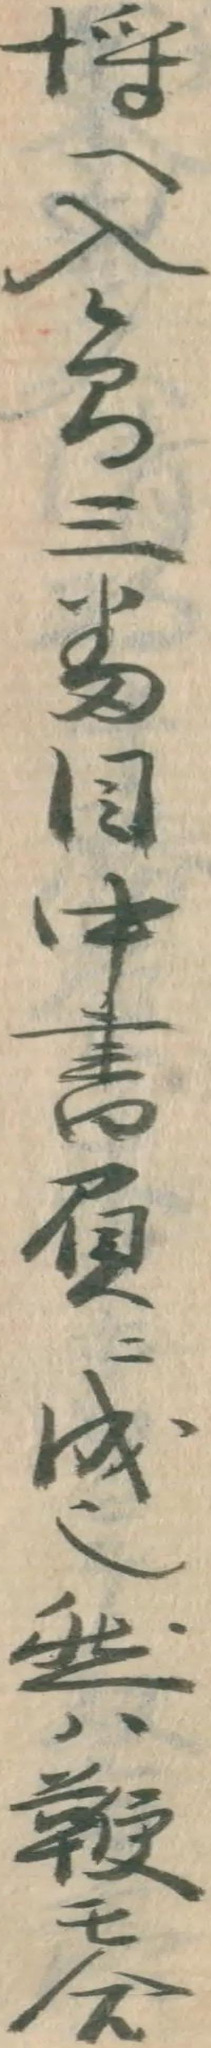埒ヘ入候間三番目中書負ニ成也然ハ鞭モ合

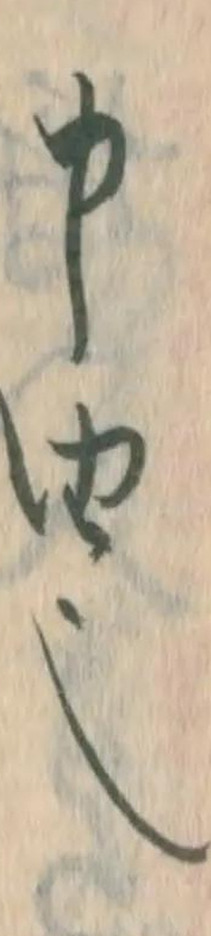申由也
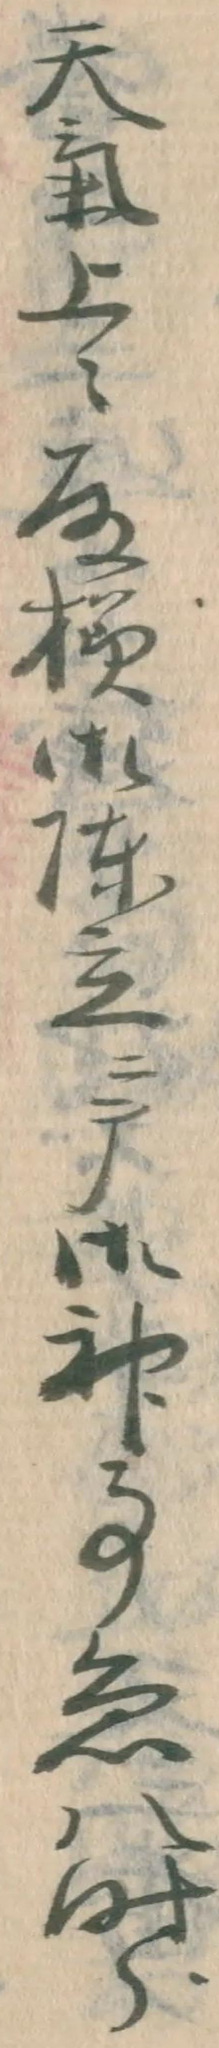天気上々殿様御陣立ニテ御神事急八時分
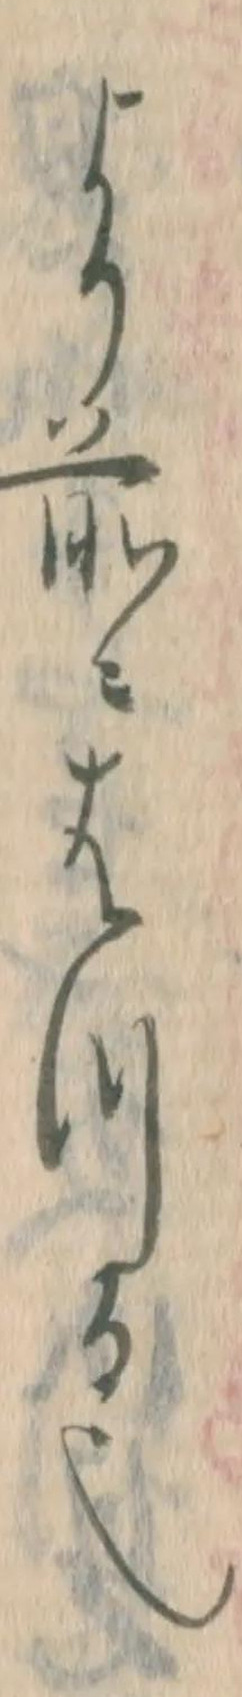より前にはつる也
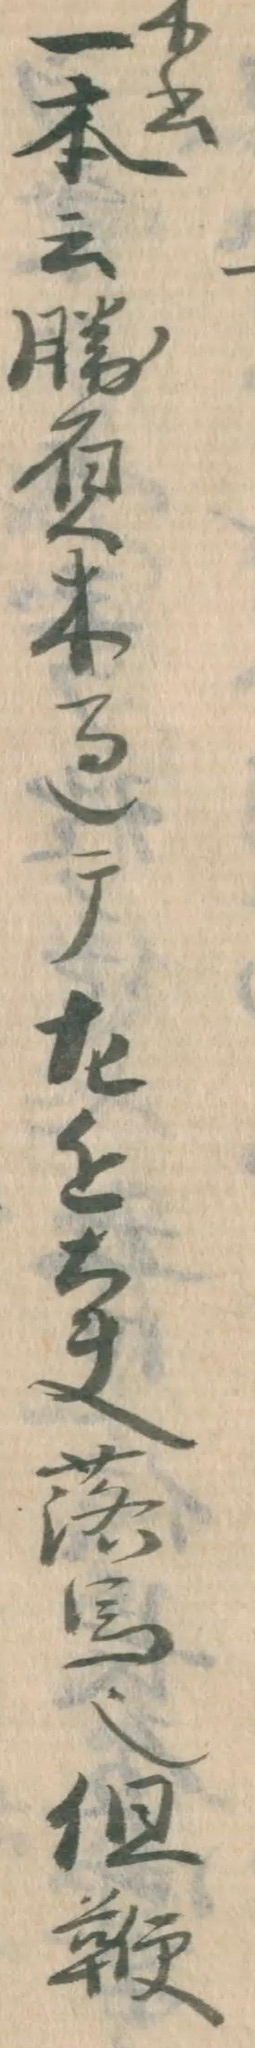一本云勝負木過テ左近大夫落馬也但鞭
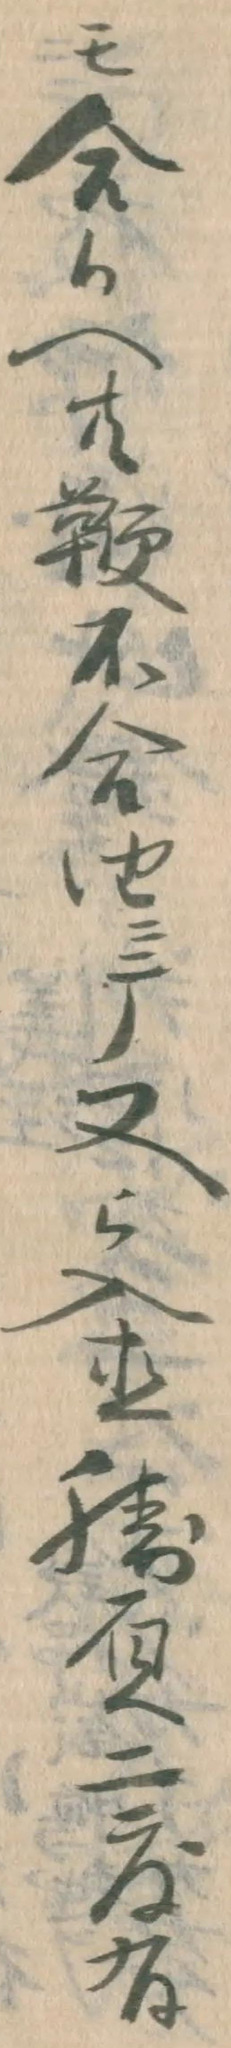モ合候へ共鞭不合由ニテ又被入直勝負二度有
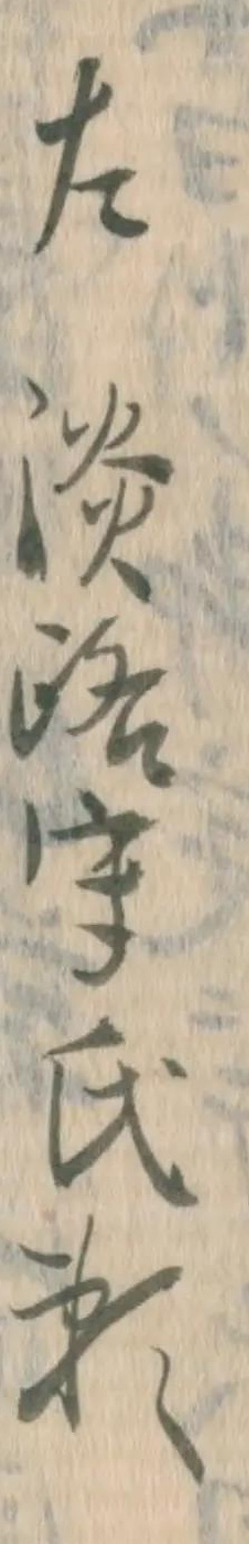左淡路守氏頼
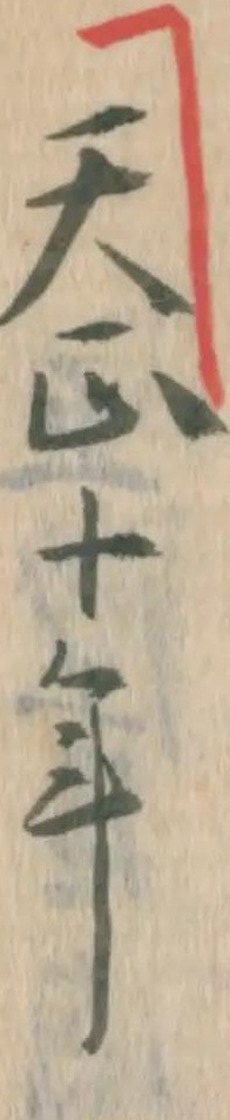天正十年
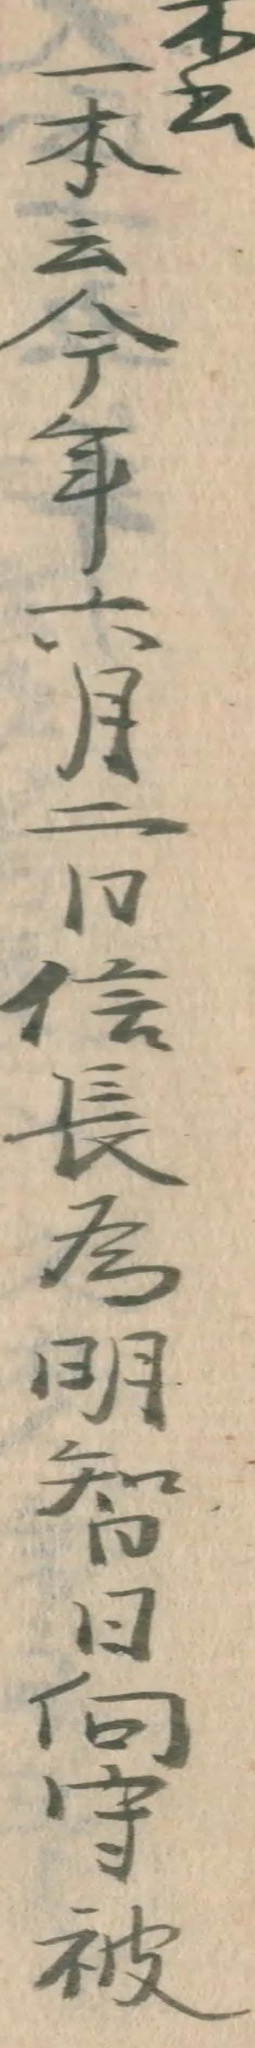一本云今年六月二日信長為明智日向守被
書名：賀茂社記録. 第10冊
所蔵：国立国会図書館 National Diet Library, JAPAN
